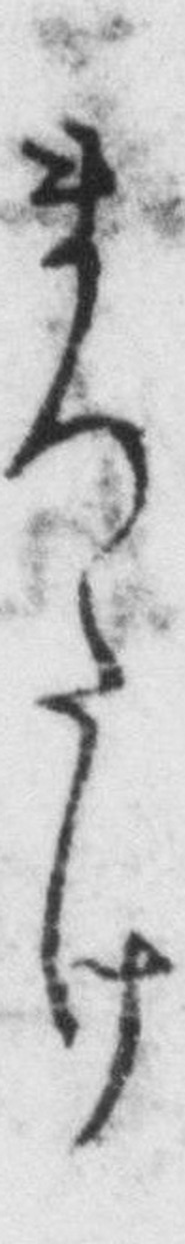まつたけ
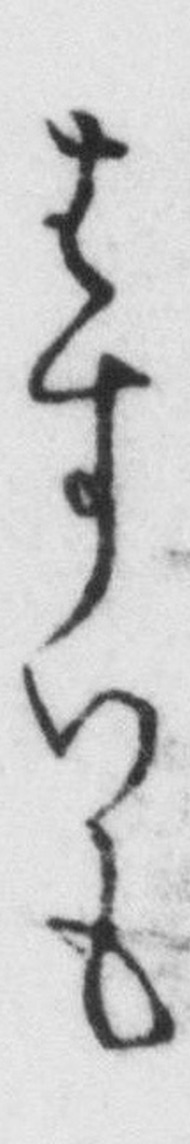はすいも

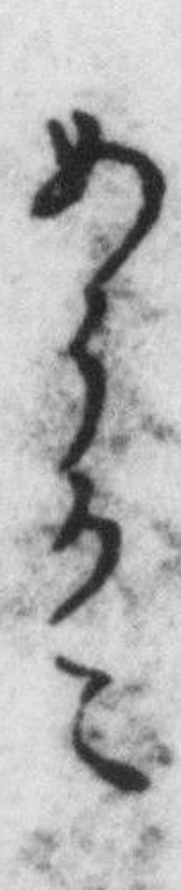めうかこ
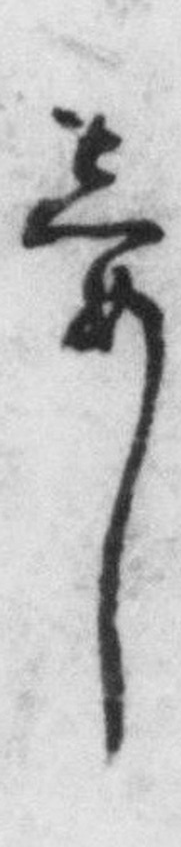しめし
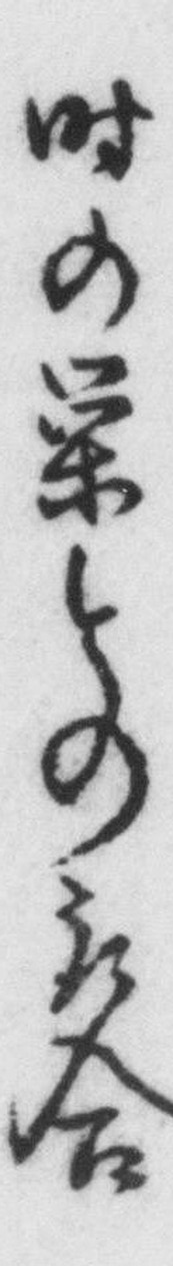時の菓もの取合
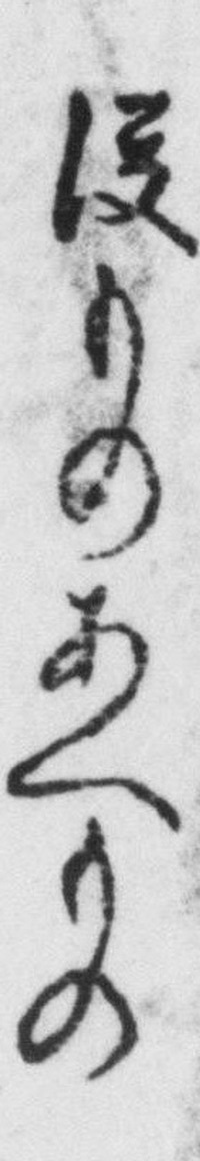浸ものあへもの
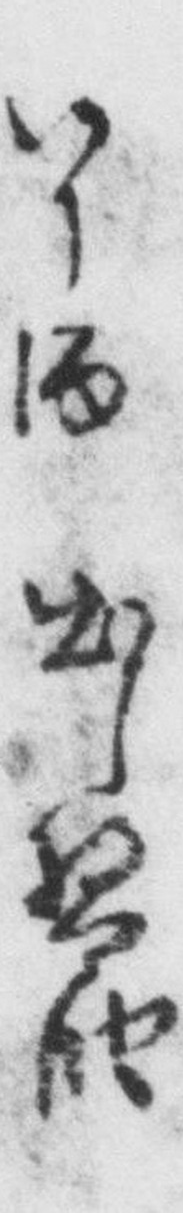いり酒出し醤油
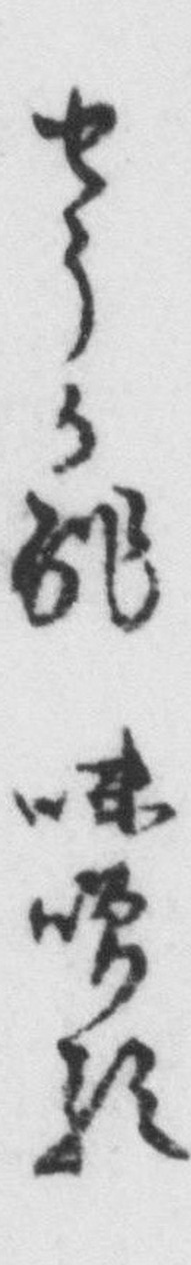せうか酢味噌類

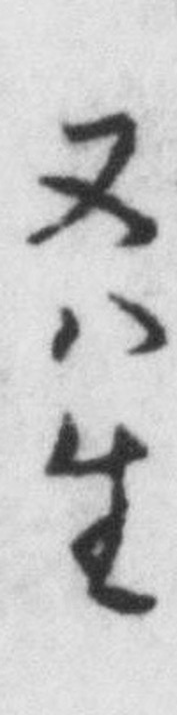又は生
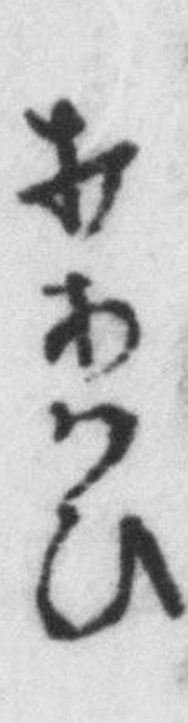打あわひ
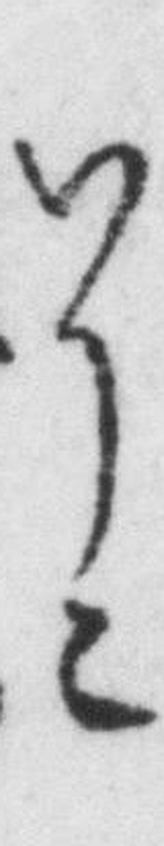いりこ
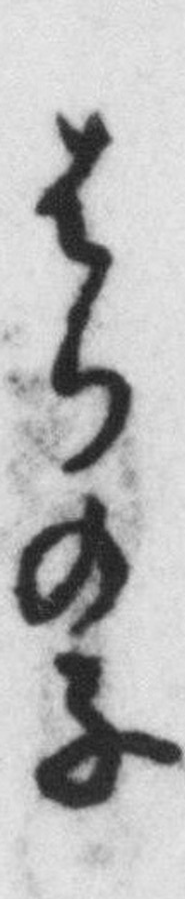はらの子
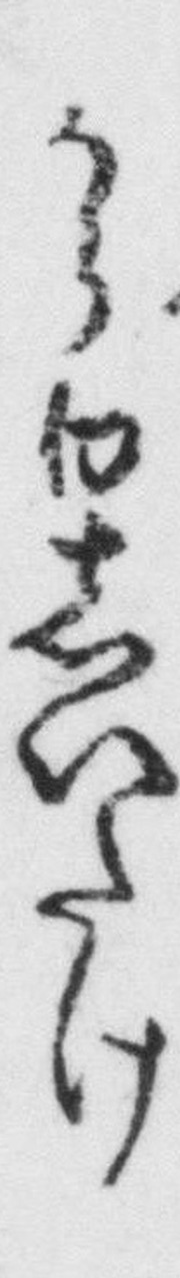うら白しいたけ
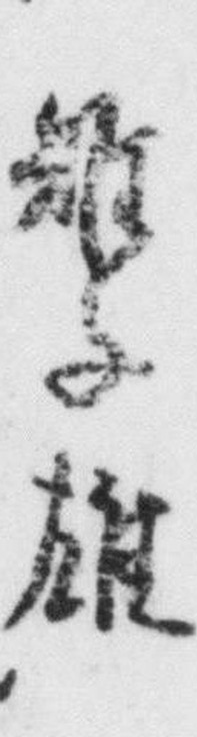雉子雄

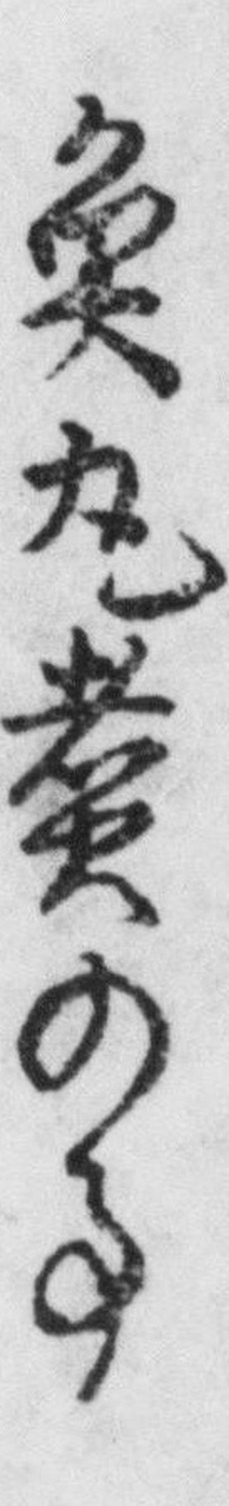魚丸煮の事
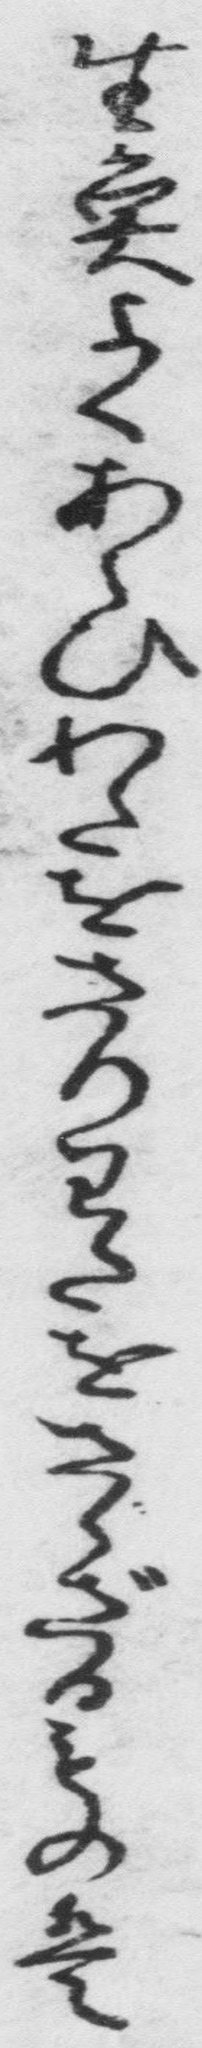生魚よくあらひわたをさりわたをさらざるものは
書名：卓子料理仕様
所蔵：大阪府立大学学術情報センター 国文学研究資料館
